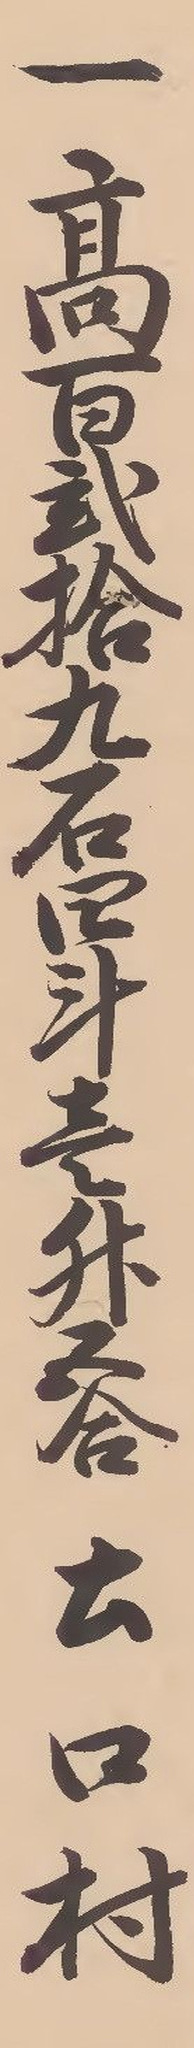一高百弐拾九石四斗壱升五合土口村

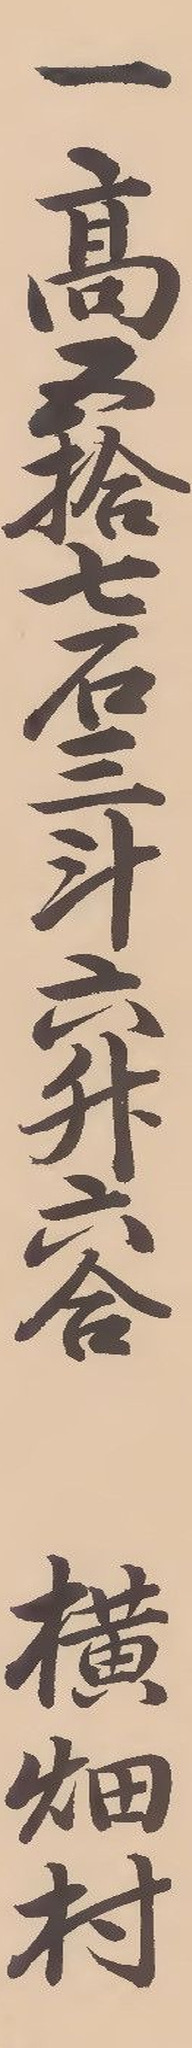一高五拾七石三斗六升六合横畑村
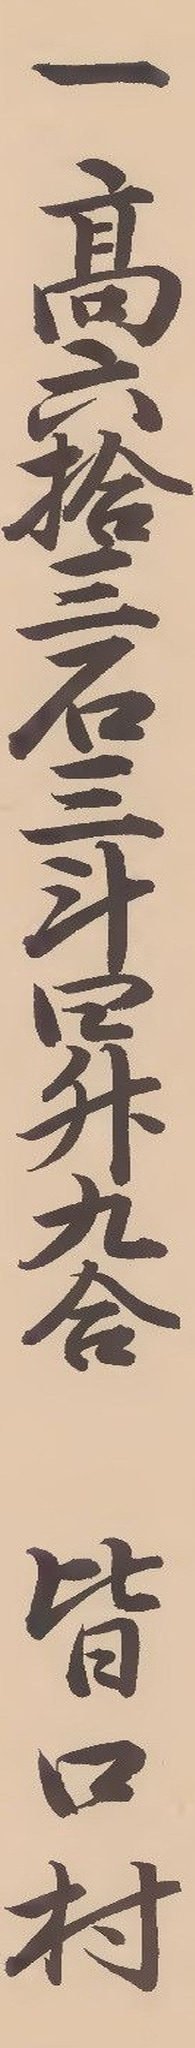一高六拾三石三斗四升九合皆口村
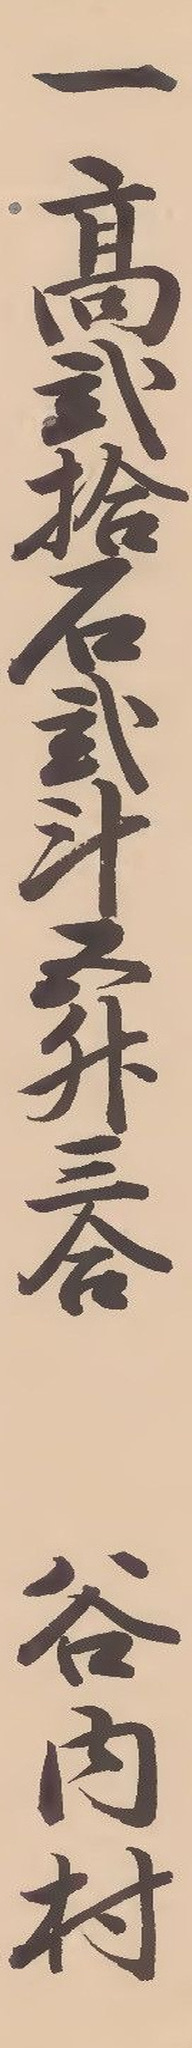一高弐拾石弐斗五升三合谷内村
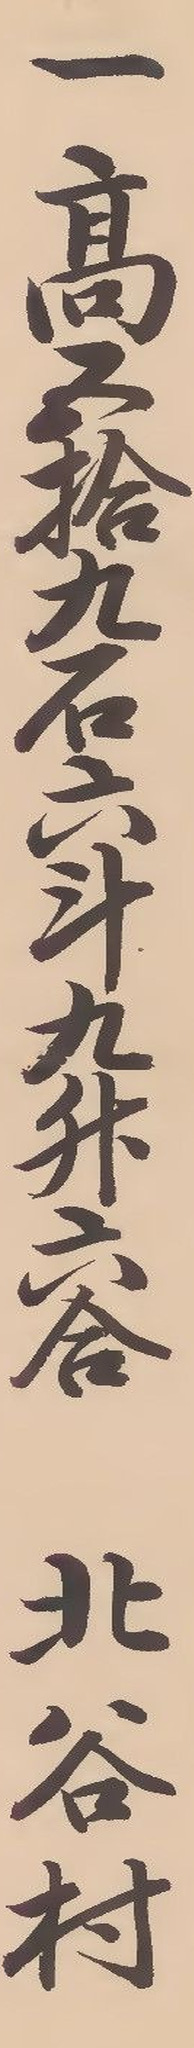一高五拾九石六斗九升六合北谷村
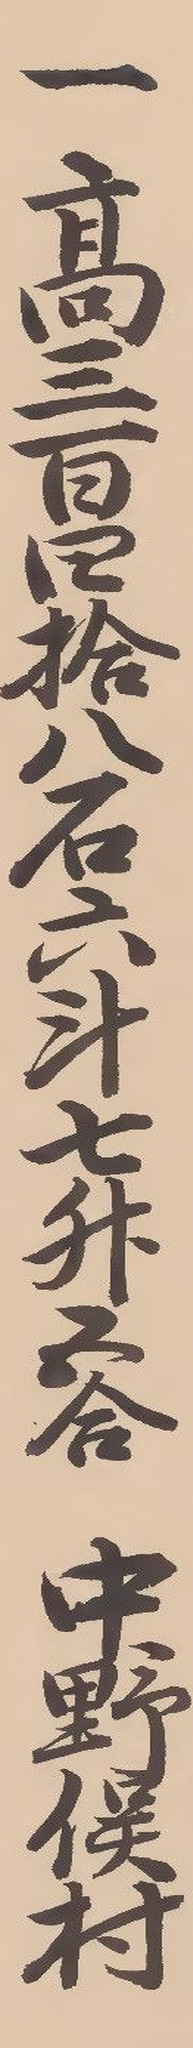一高三百四拾八石六斗七升五合中野俣村
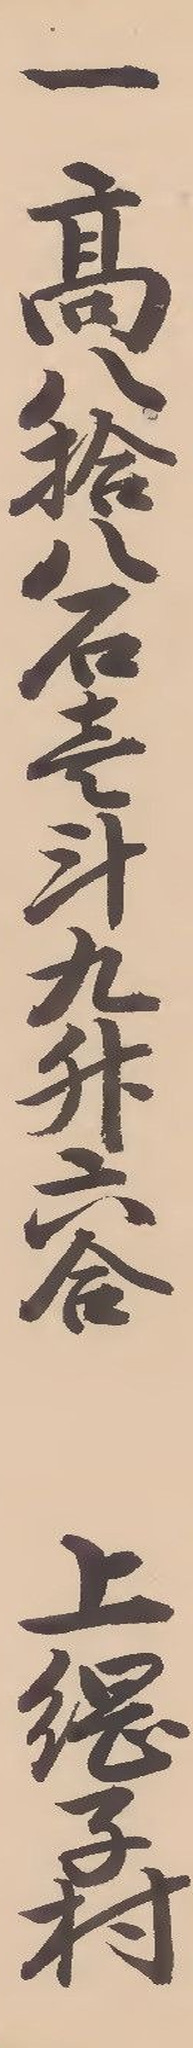一高八拾八石壱斗九升六合上綱子村
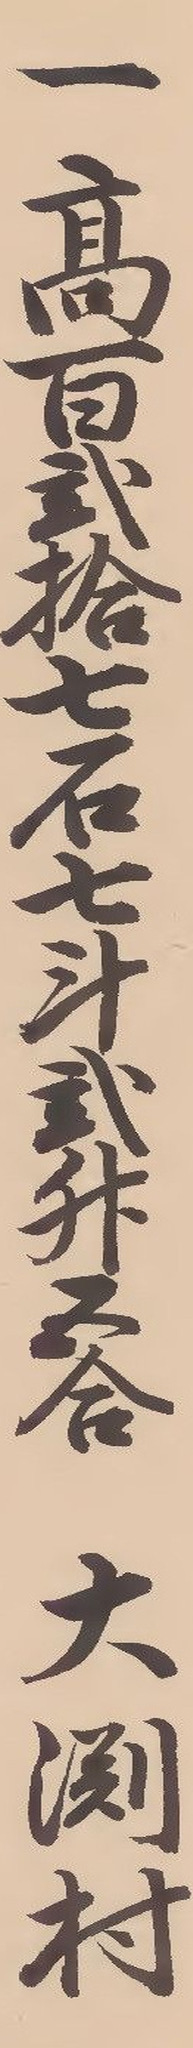一高百弐拾七石七斗弐升五合大淵村
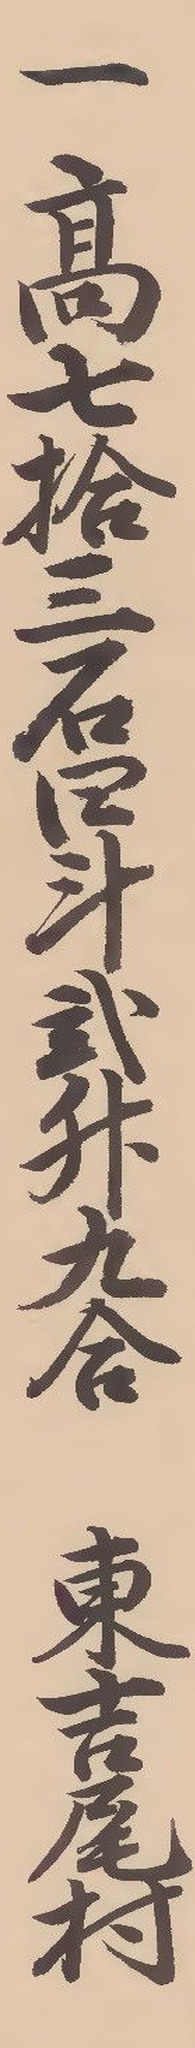一高七拾三石四斗弐升九合東吉尾村

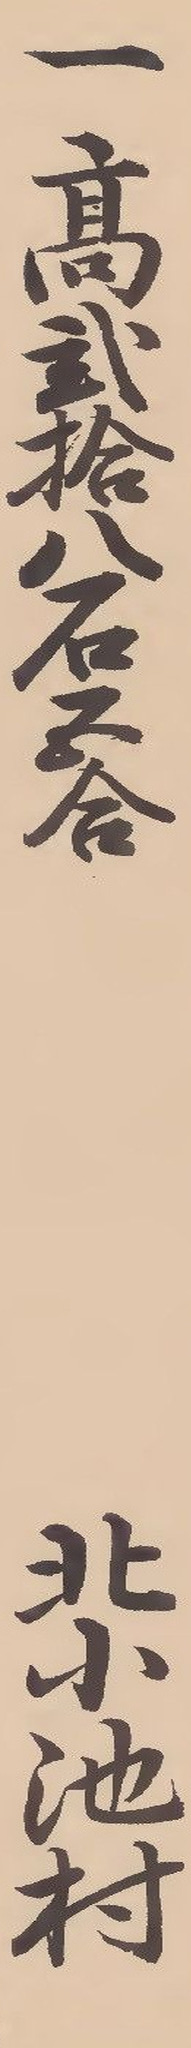一高弐拾八石五合北小池村
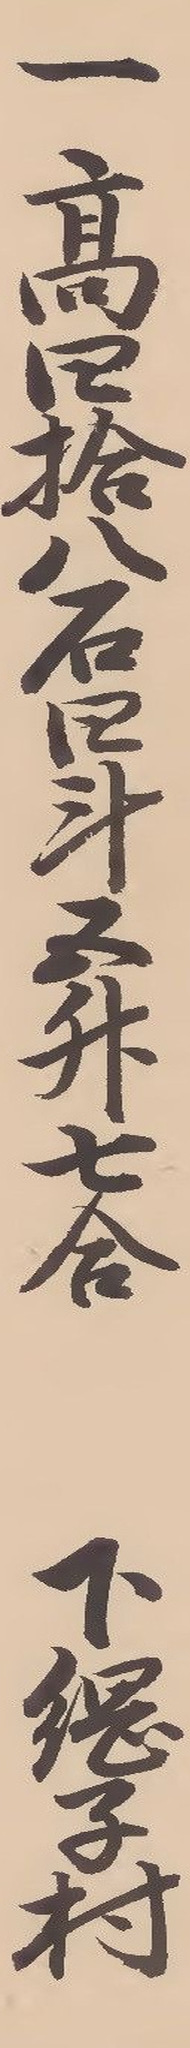一高四拾八石四斗五升七合下綱子村
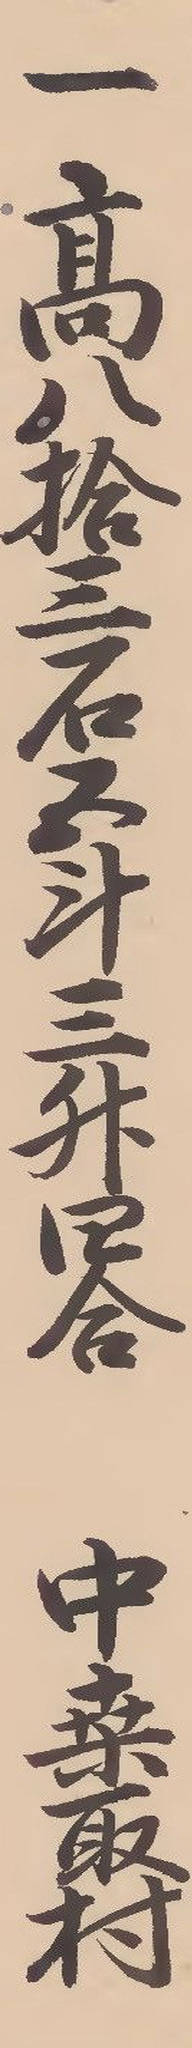一高八拾三石五斗三升四合中桑取村
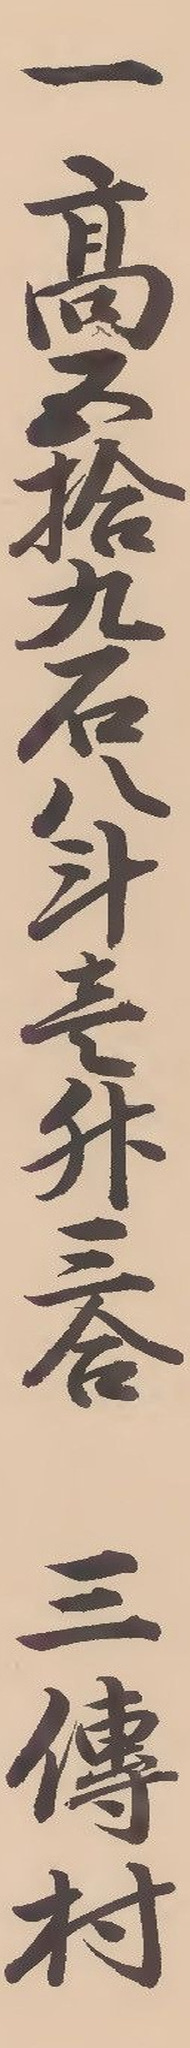一高五拾九石八斗壱升三合三伝村
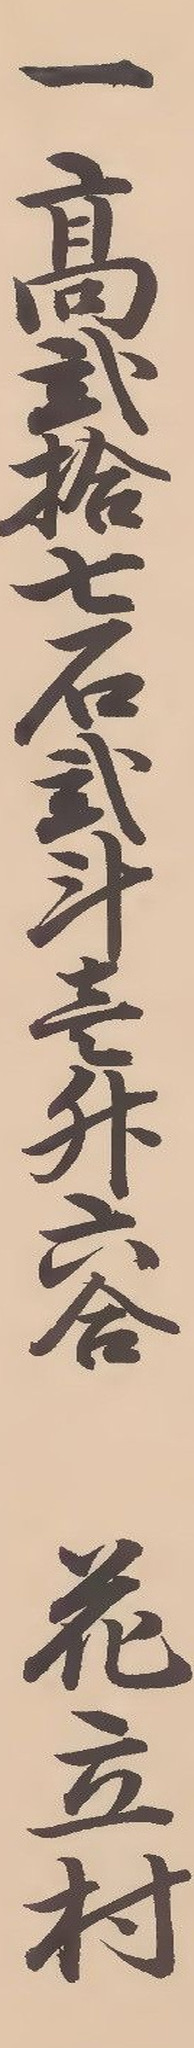一高弐拾七石弐斗壱升六合花立村
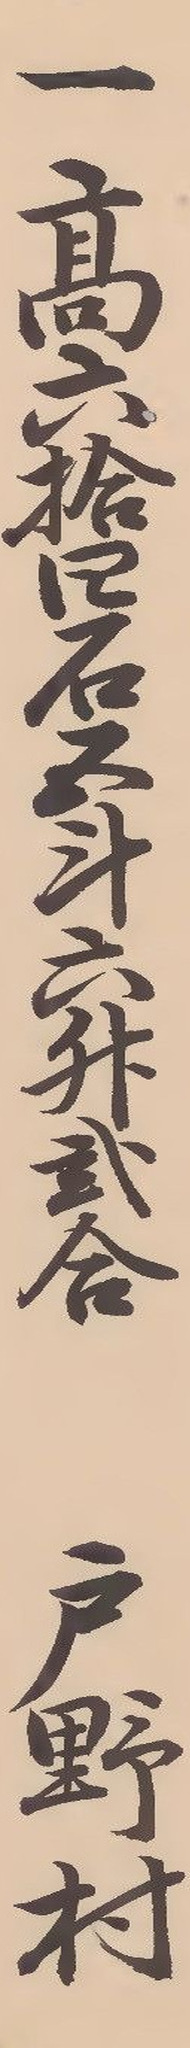一高六拾四石五斗六升弐合戸野村
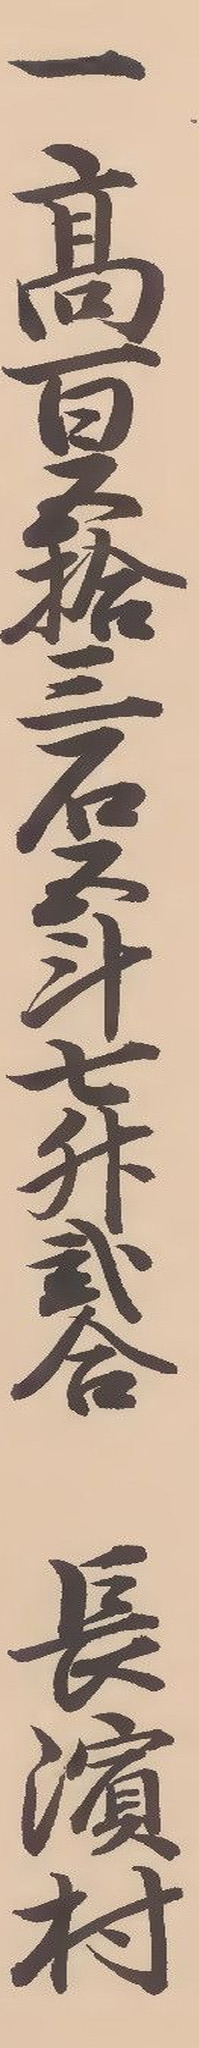一高百五拾三石五斗七升弐合長浜村
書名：越後国郷帳　上
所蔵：国立公文書館 National Archives of Japan
